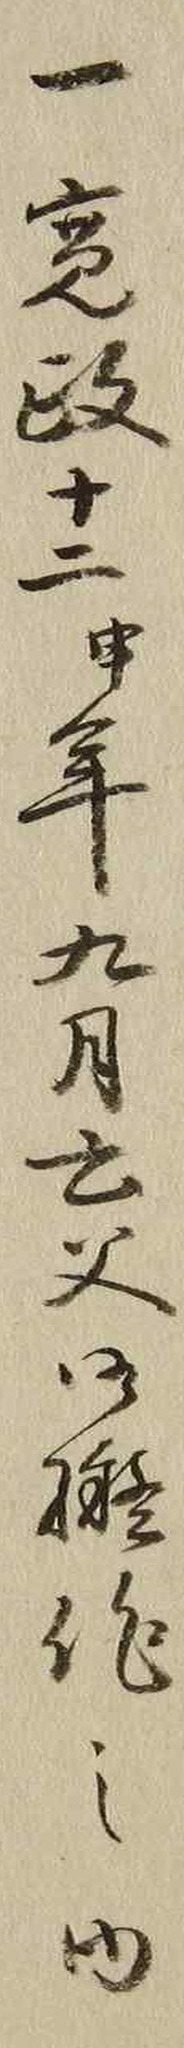一寛政十二申年九月亡父御擬作之内
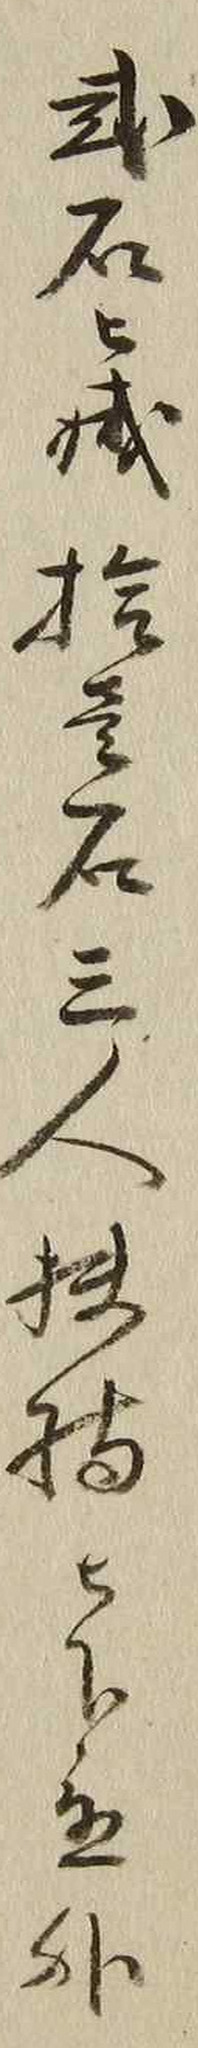弐石被減拾壱石三人扶持被下置外
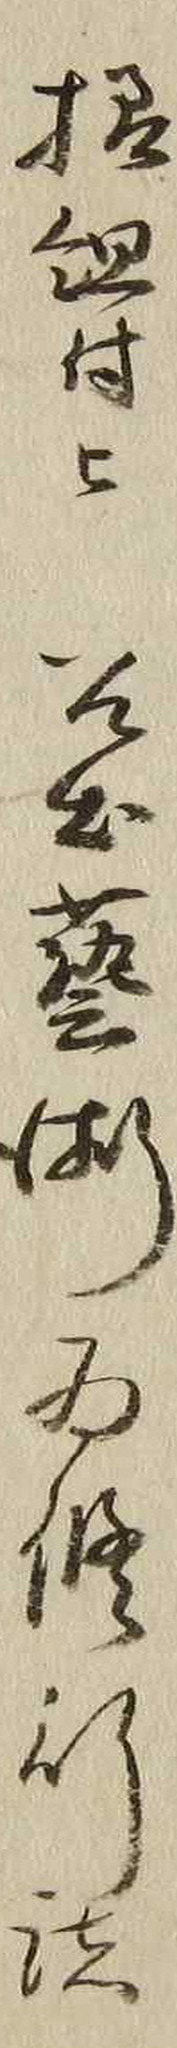様組付被召出芸術為修行諸
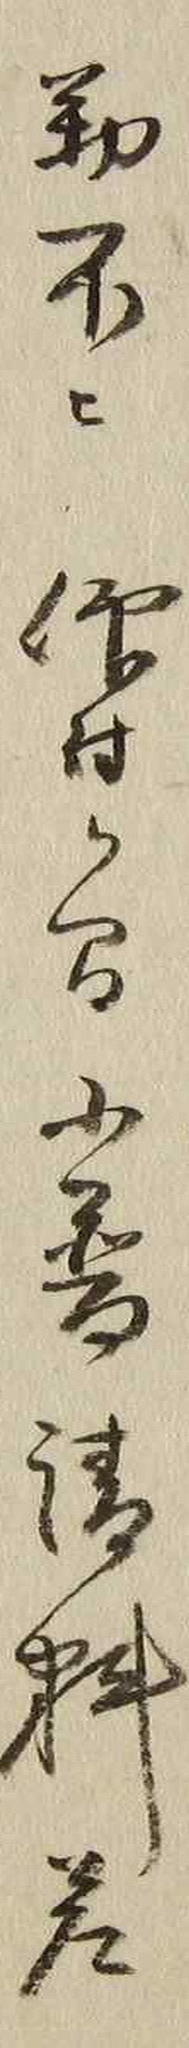勤不被仰付候間小普請料差
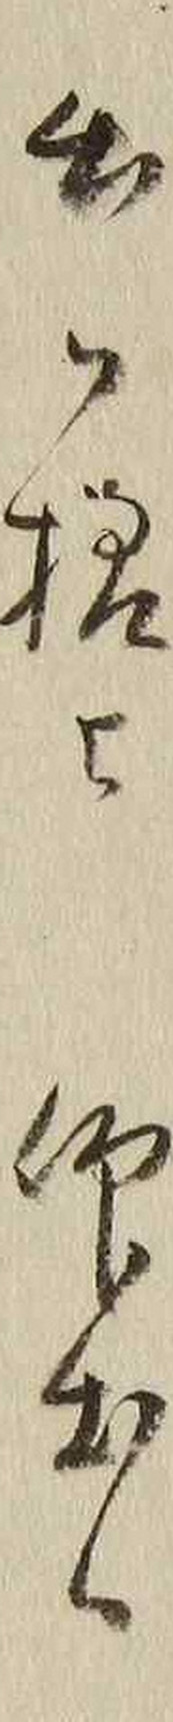出候様被仰出候
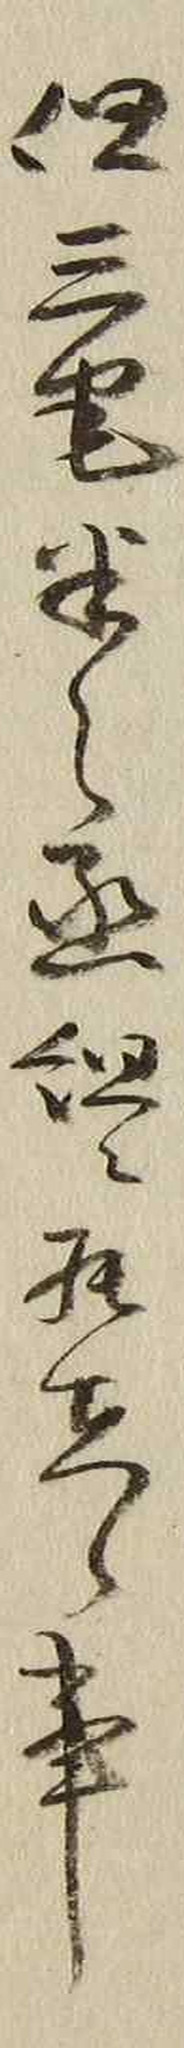但三宅半之丞組ニ罷在候事
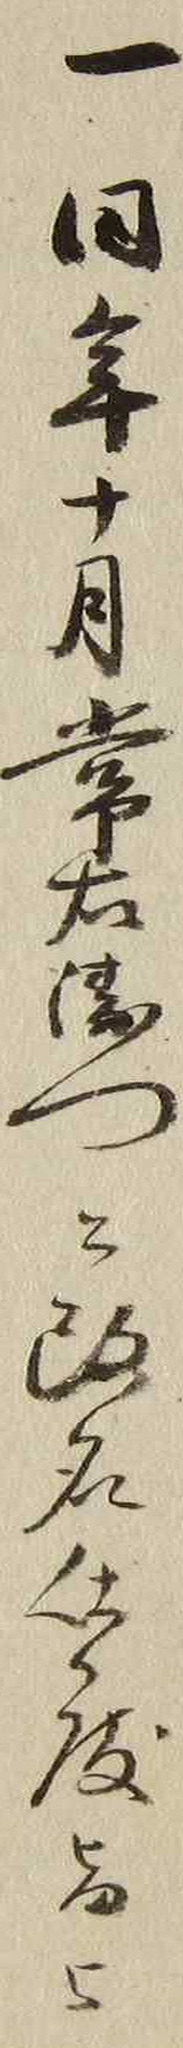一同年十月常右衛門ニ改名仕度旨被
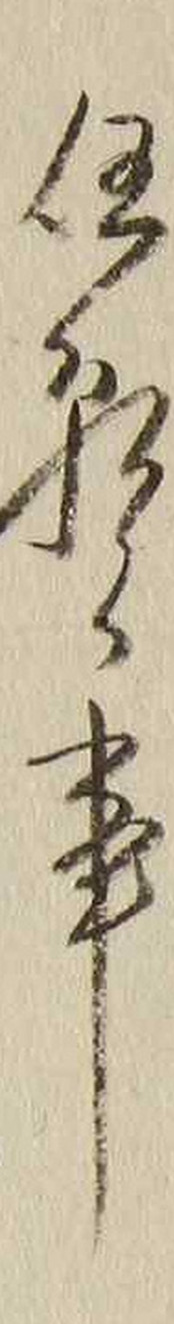任願候事
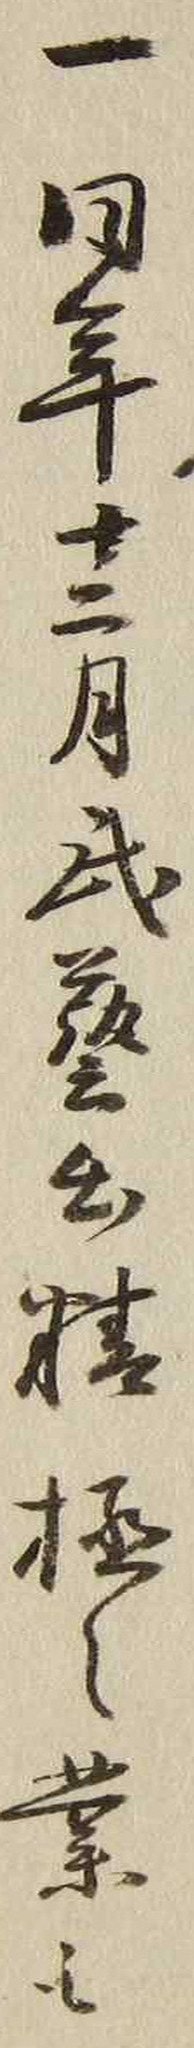一同年十二月武芸出精極之業も
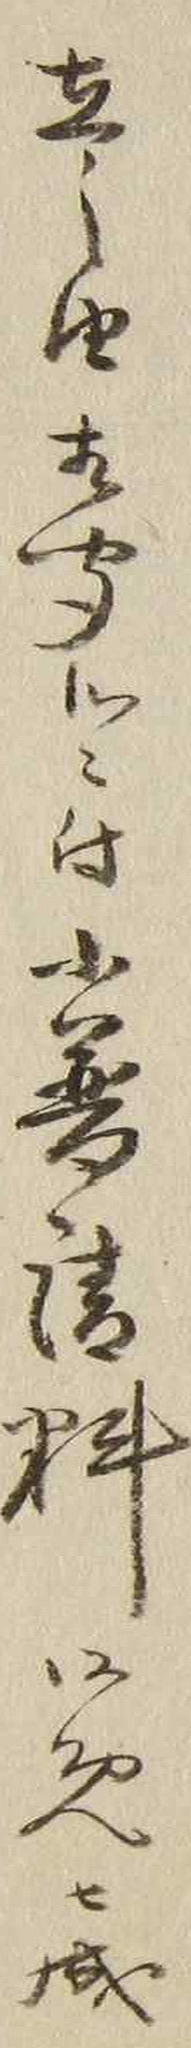在之由相聞候ニ付小普請料御免被成
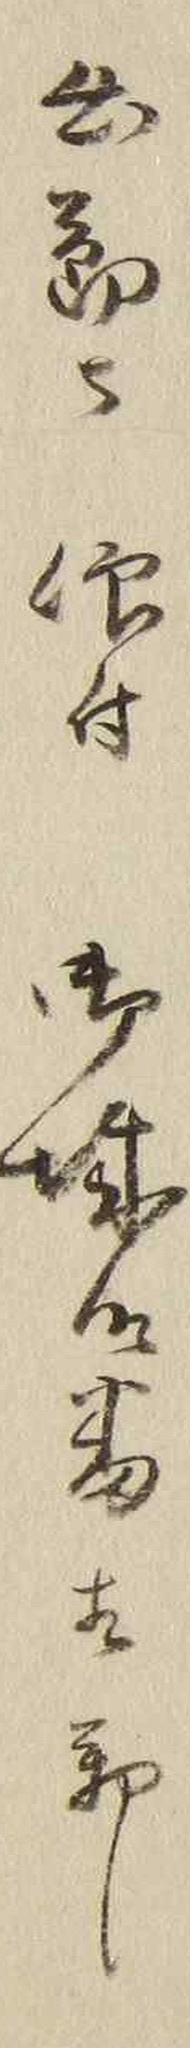出勤被仰付御城御番相勤候

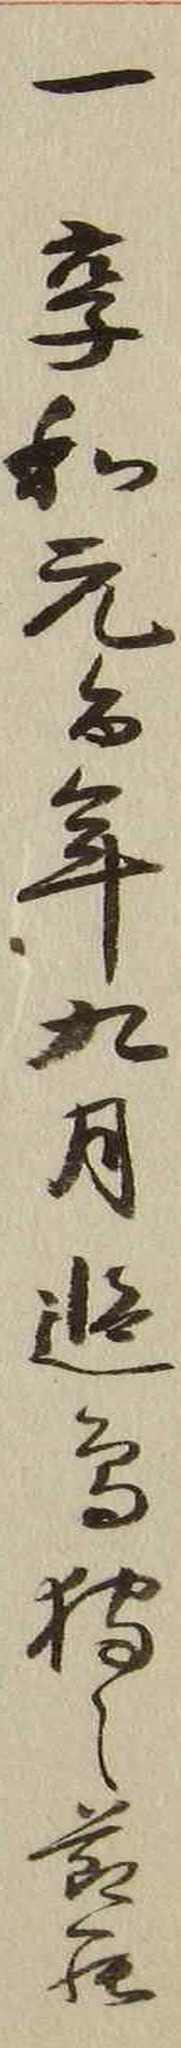一享和元酉年九月追鳥狩之節罷
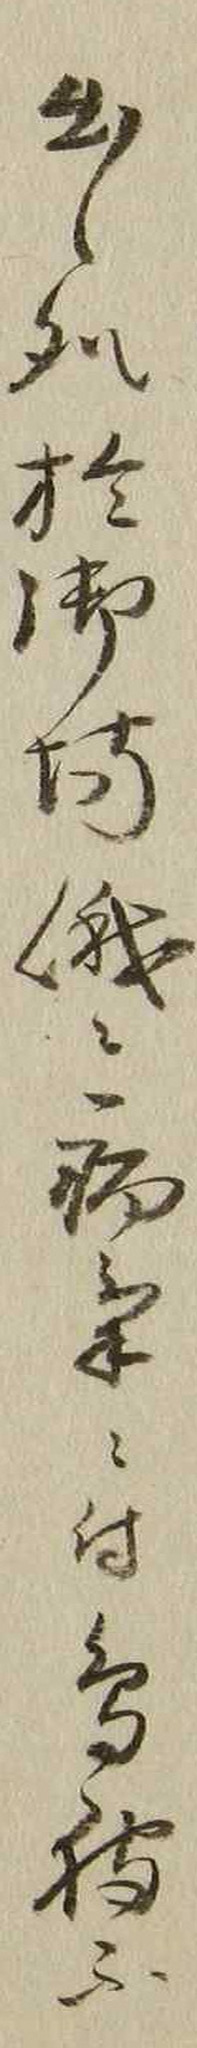出候処於御場俄ニ病気ニ付鳥狩不
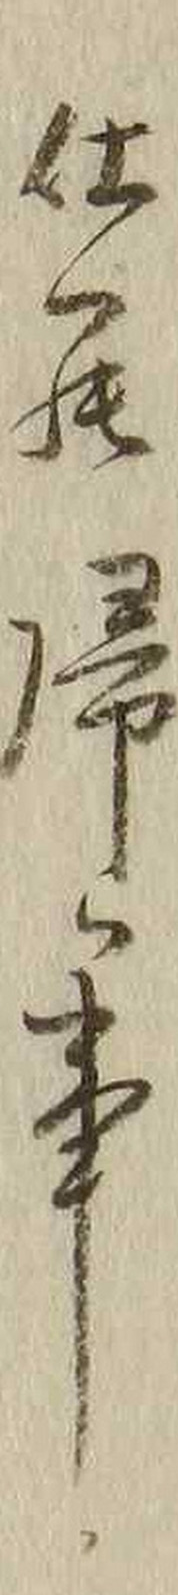仕罷帰候事
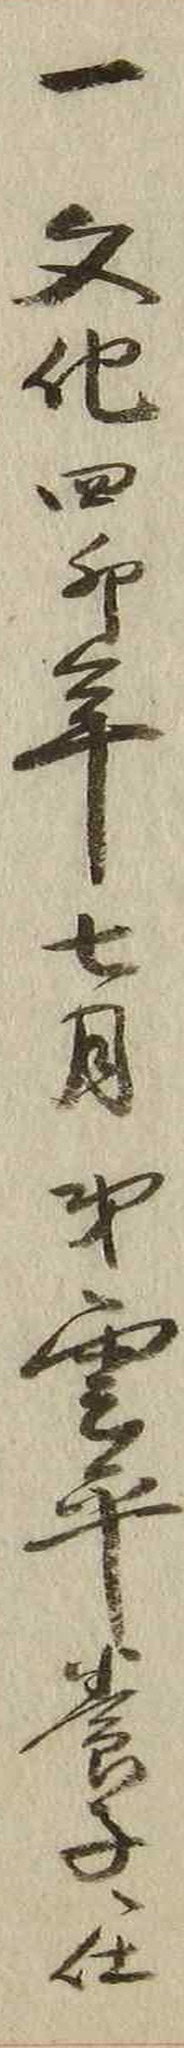一文化四卯年七月弟雲平養子ニ仕
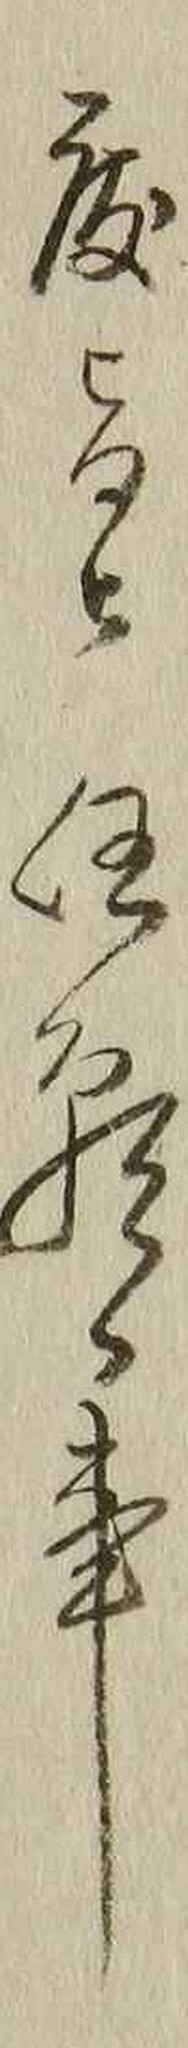度旨被任願候事
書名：諸士系譜　巻之236　ふ之部4
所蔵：会津若松市立会津図書館
